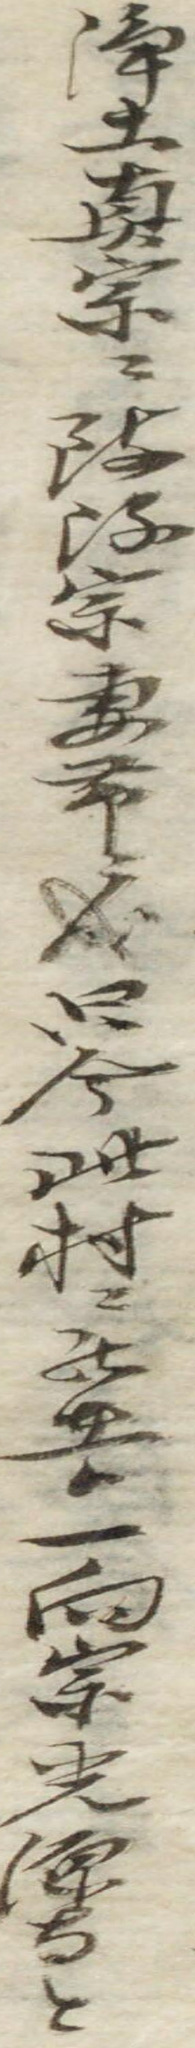浄土真宗に致改宗妻帯成只今此村に罷在候一向宗光源寺と
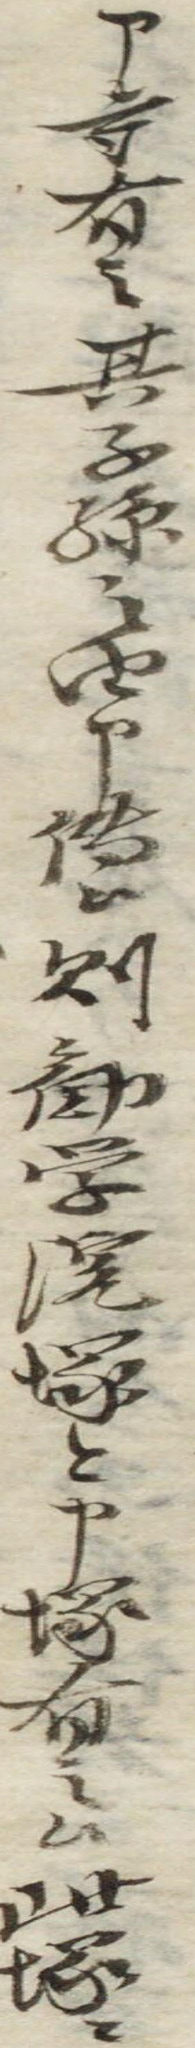申寺有之其子孫之由申伝候則勧学院塚と申塚有之候此塚に
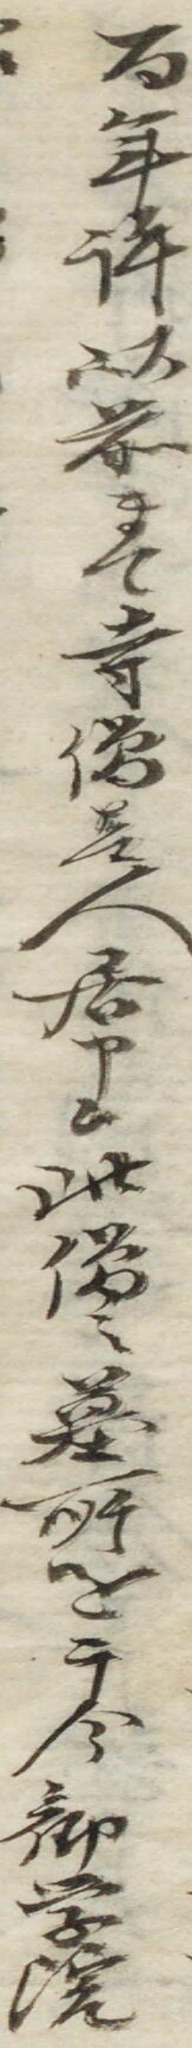百年許以前まて寺僧壱人居申候此僧之墓所を于今勧学院
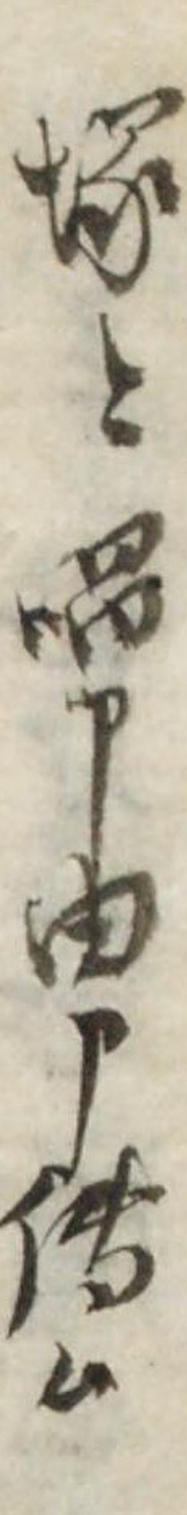塚と唱申由申伝候
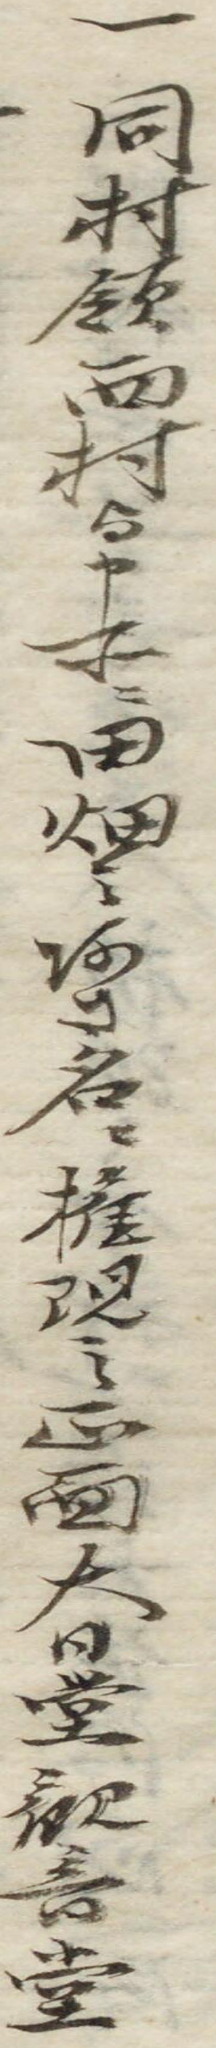一同村領西村与申所に田畑之あさ名に権現之正面大日堂観音堂
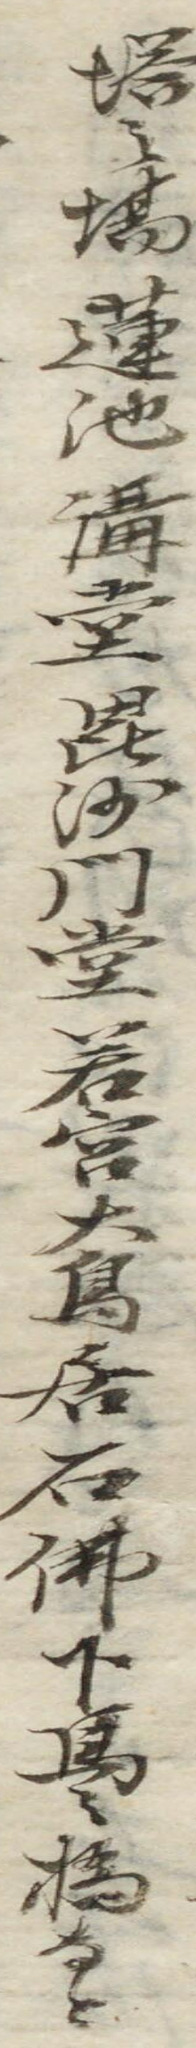塔之場蓮池講堂毘沙門堂若宮大鳥居石仏下馬之橋なと
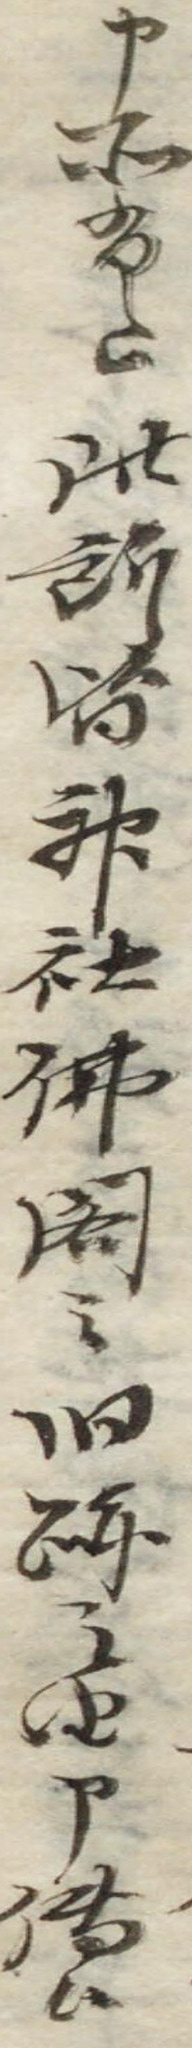申所有之候此所皆神社仏閣之旧跡之由申伝候
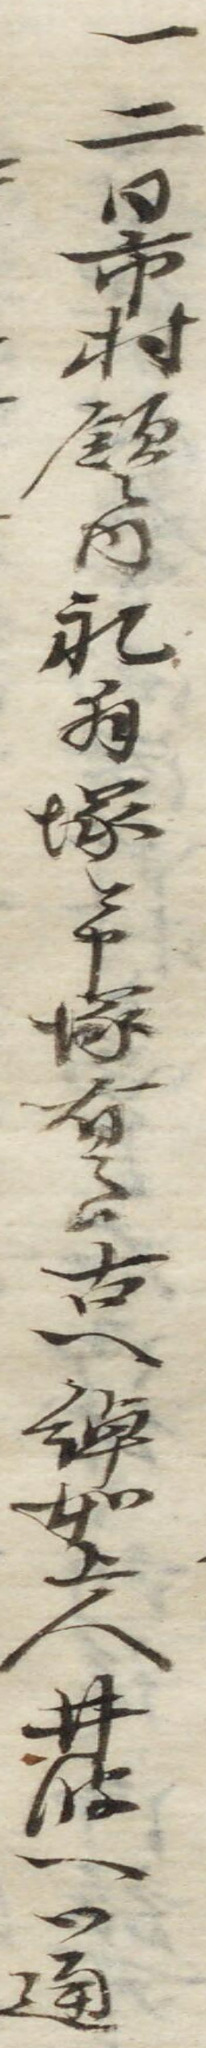一二日市村領之内礼拝塚と申塚有之候古へ綽如上人井波へ御通
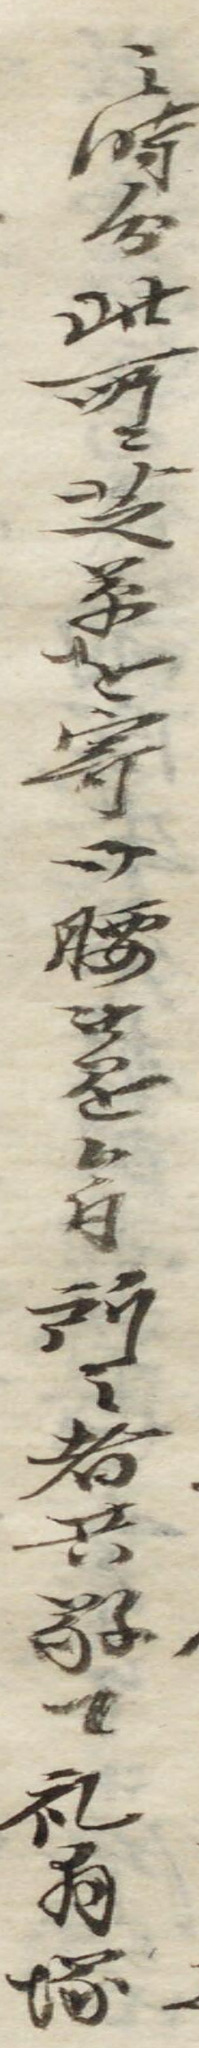之時分此所に芝草を寄御腰被懸候付所之者共敬て拝礼塚
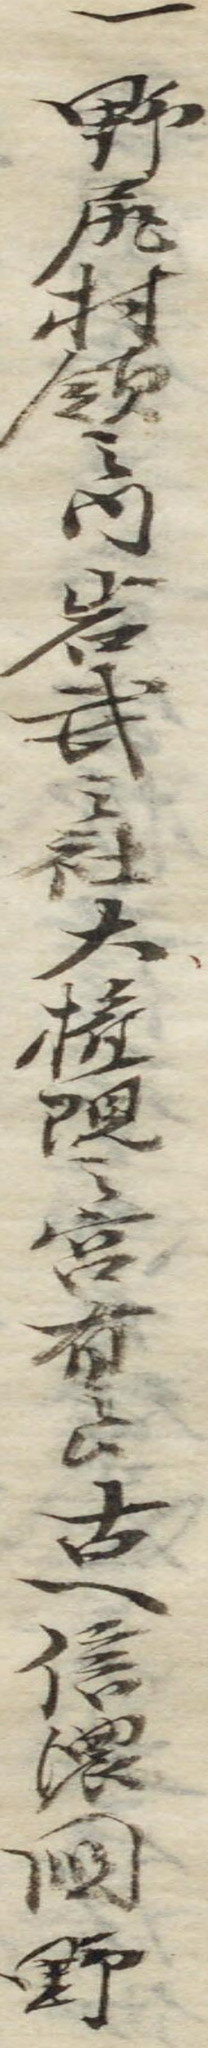一野尻村領之内岩武之社大権現之宮有之候古へ信濃国野
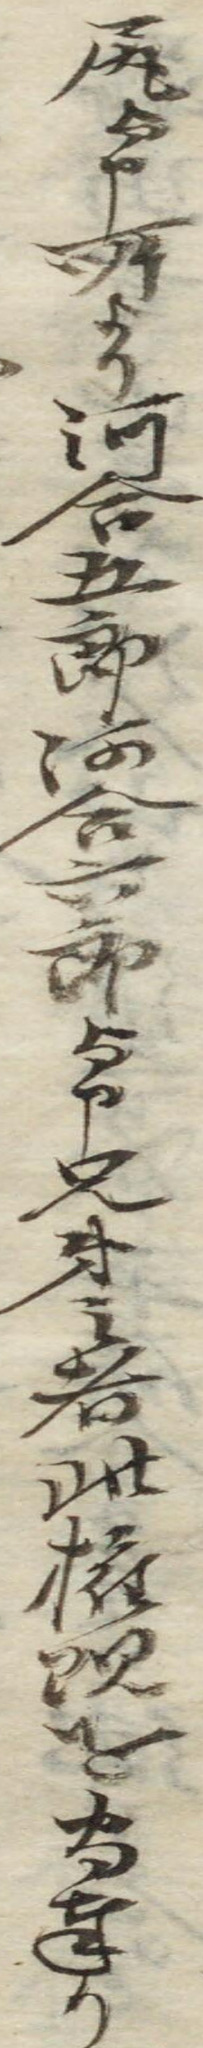尻与申所より河合五郎河合六郎与申兄弟之者此権現を守奉り
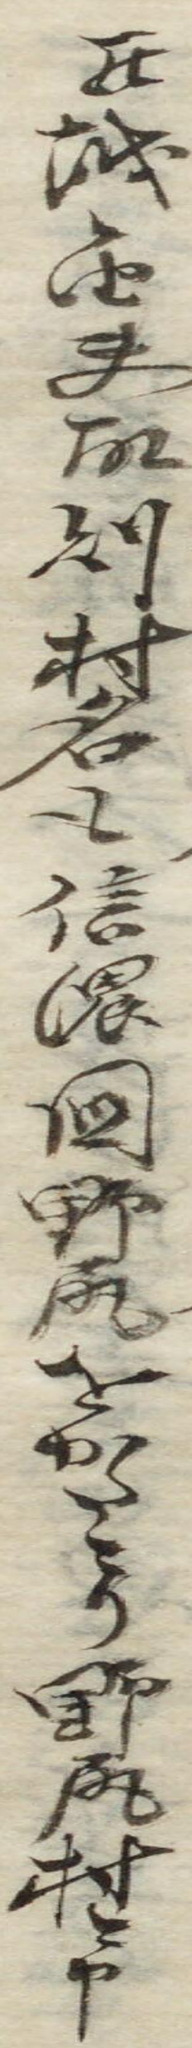罷越候由夫故則村名も信濃国野尻をかたとり野尻村と申
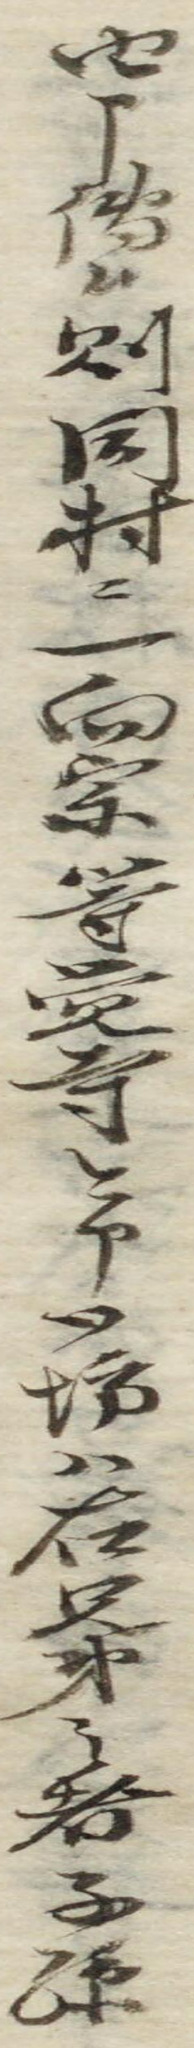由申伝候則同村に一向宗等覚寺と申御坊は右兄弟之者子孫
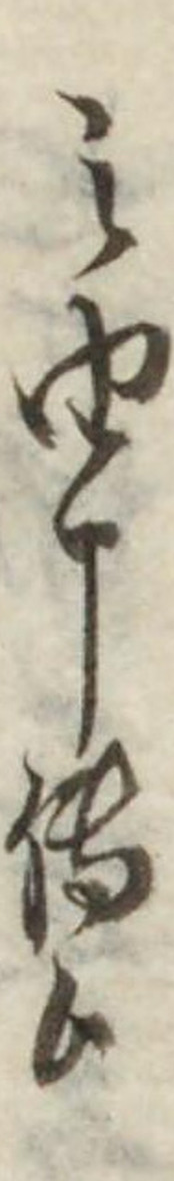之由申伝候
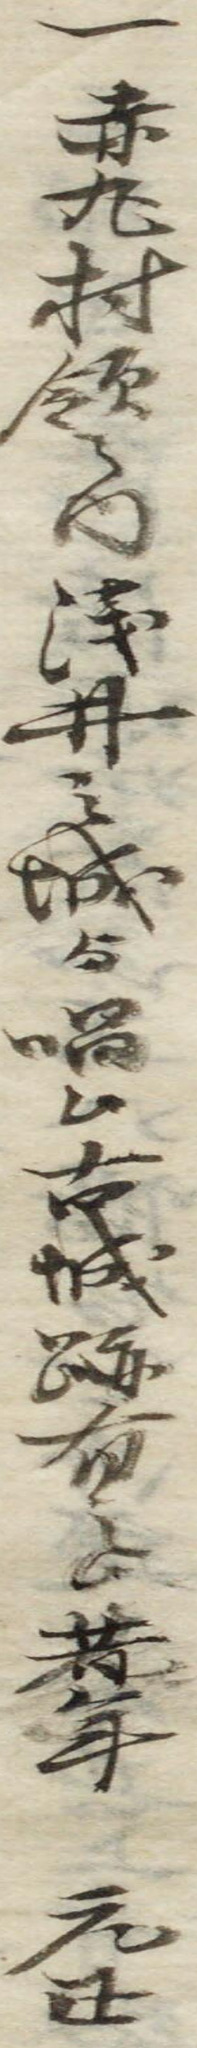一赤丸村領之内浅井之城与唱候古城跡有之候昔年元正
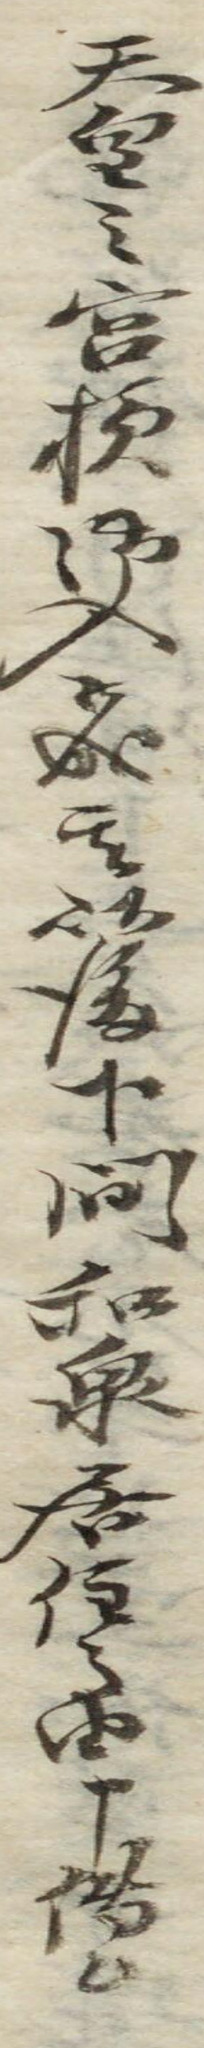天皇之宮様御入被成其以後下間和泉居住之由申伝候
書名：加越能旧聞録
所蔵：Ishikawa Prefectural Library
